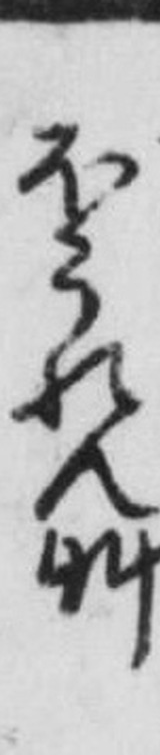ほうれん草
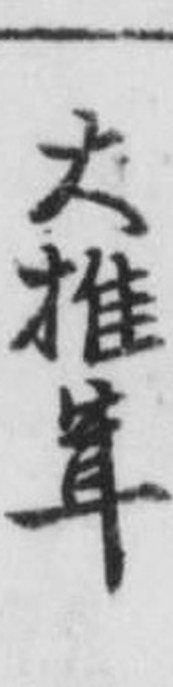大椎茸
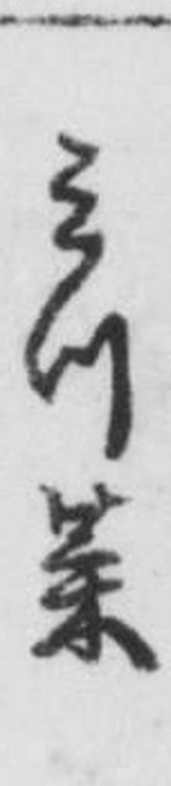みつ菜
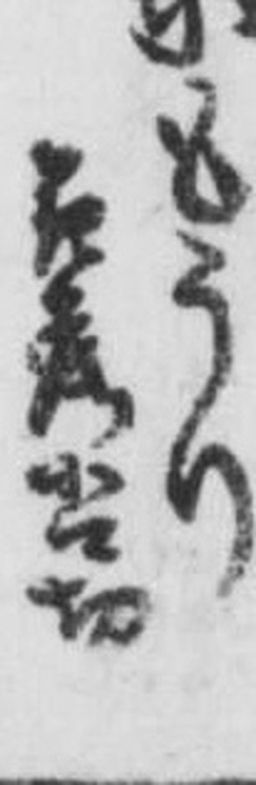花落小口切
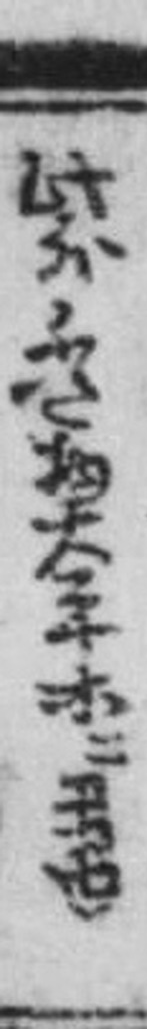此外ふた物大平等に用ゆ
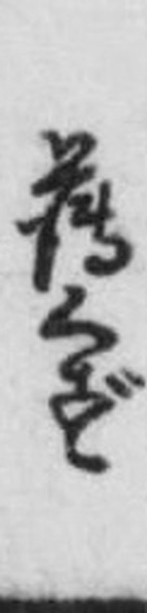薄くず
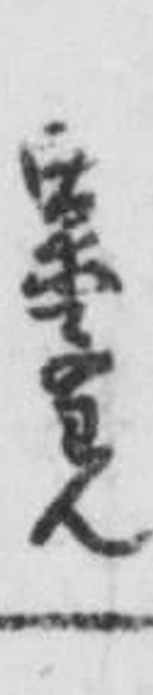菓子わん
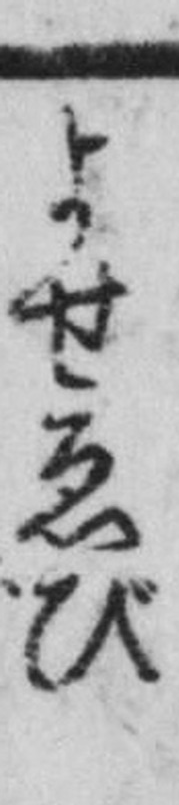よせゑび
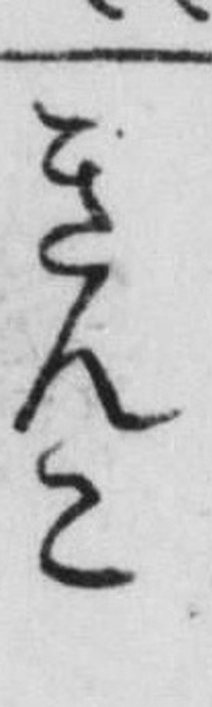きんこ
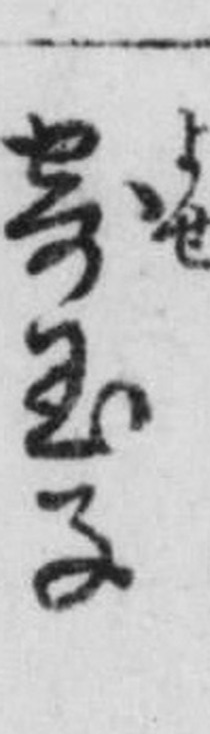寄玉子
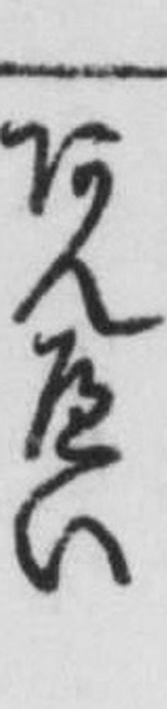あんへい
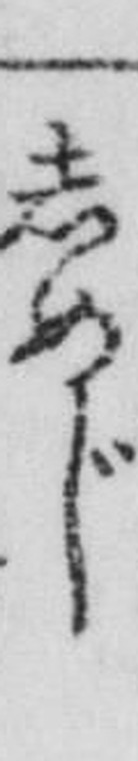しめじ
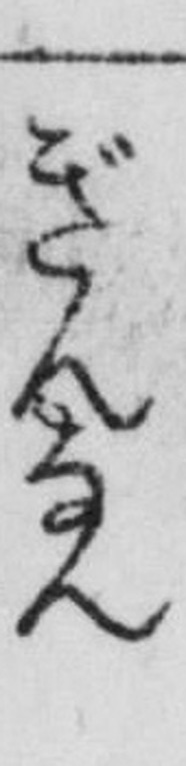ぎんなん
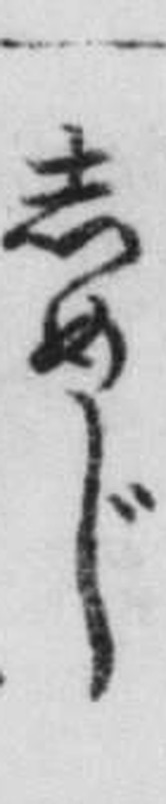しめじ
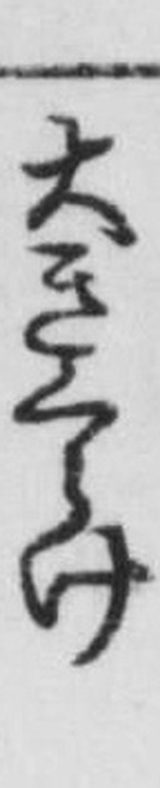大きくらけ
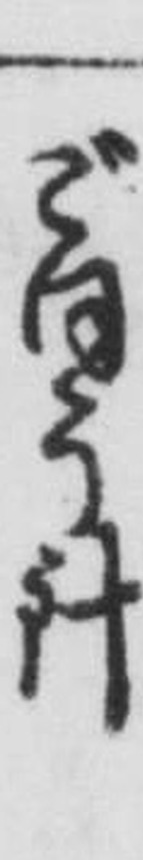ごぼう針
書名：精進魚類間合料理/早速庖丁
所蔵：大阪府立大学学術情報センター 国文学研究資料館
